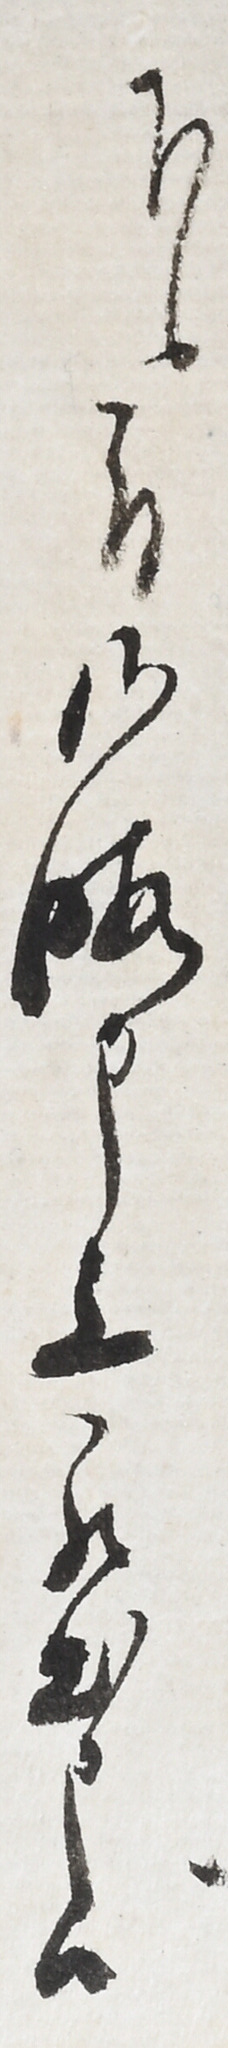下候ニ付御暇申上罷出申候
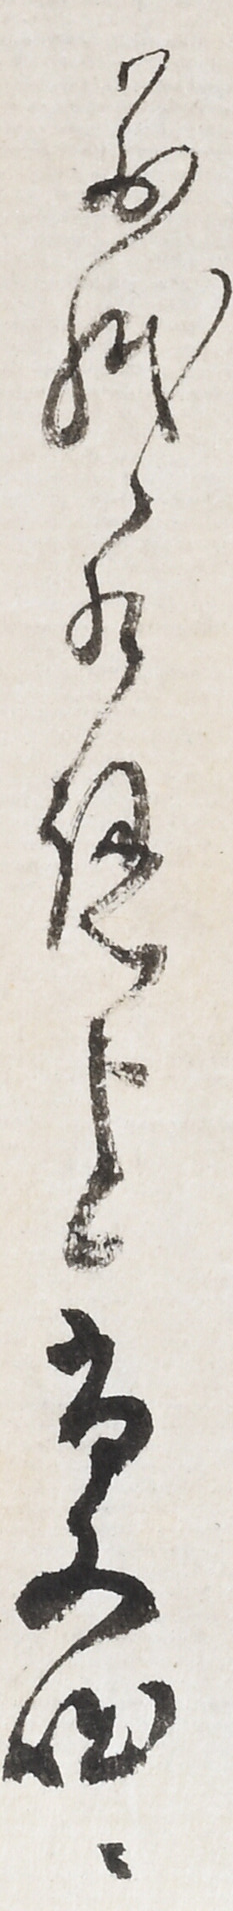別紙へ相認申候尚又咄ニ
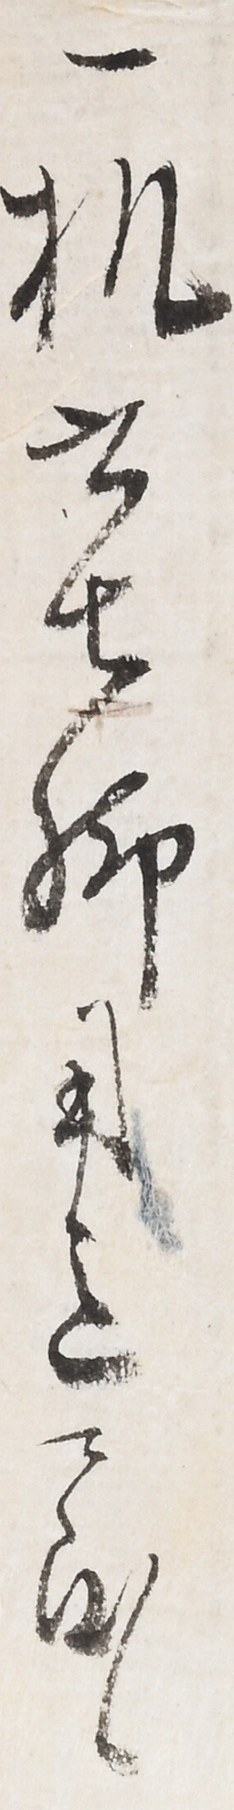一机六七脚用意可致候
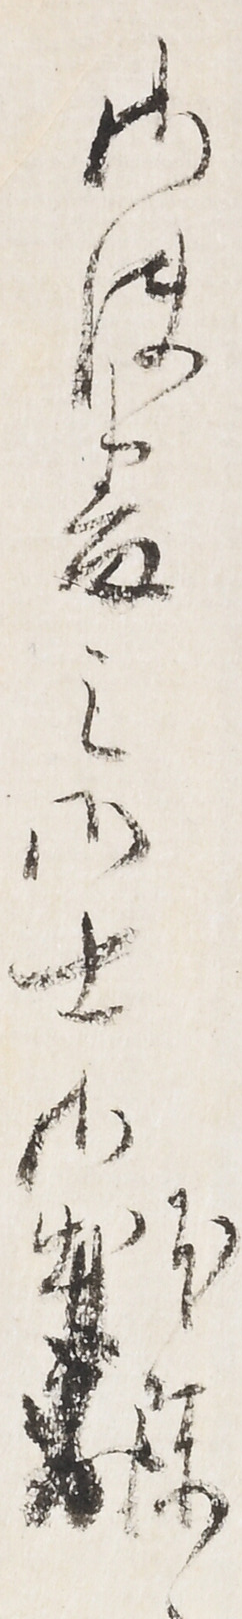御使番之御方御本陣へ
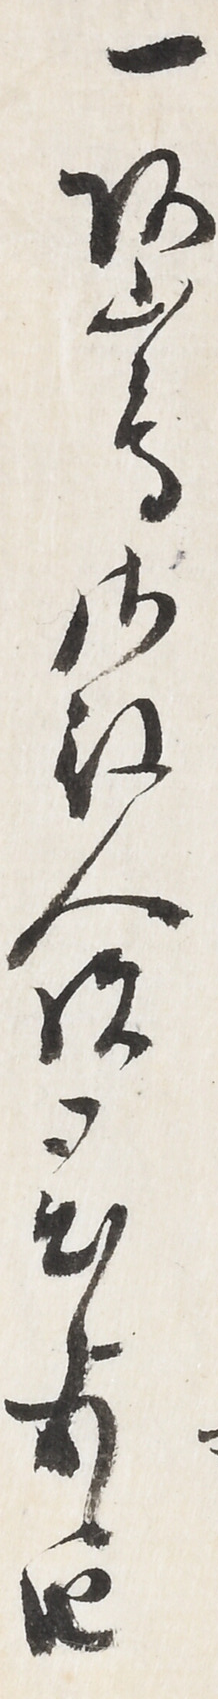一阿島御役人様御出被成候由
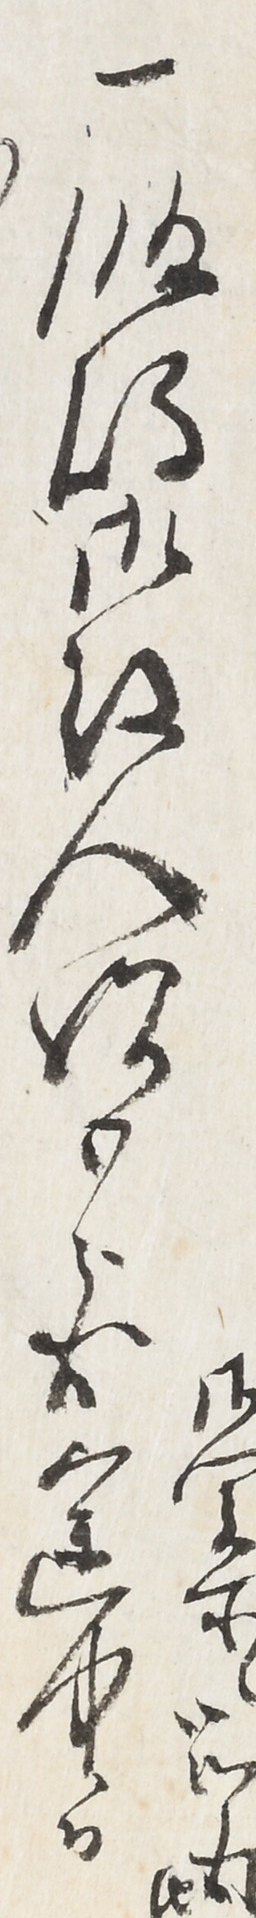一飯島御役人様御被成途中ニ而
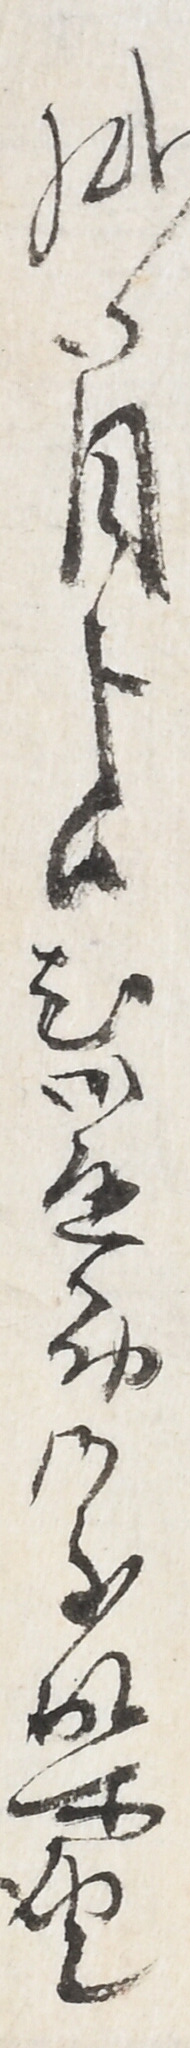掛御目申候尤御通筋御手配所御座候

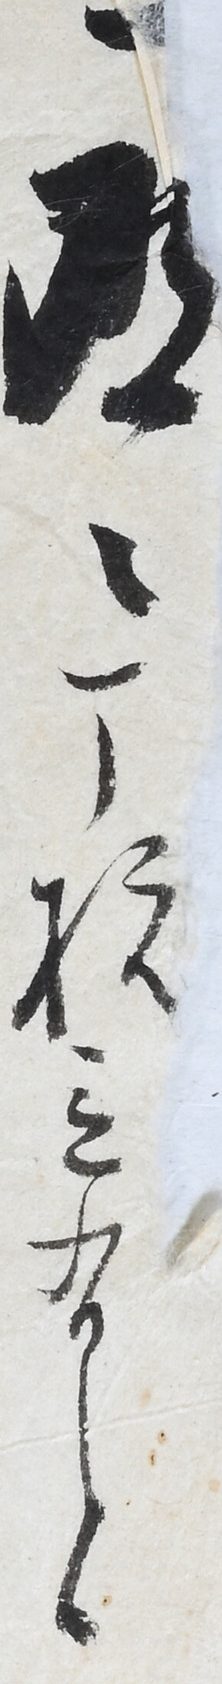一道々丁杭立有之候
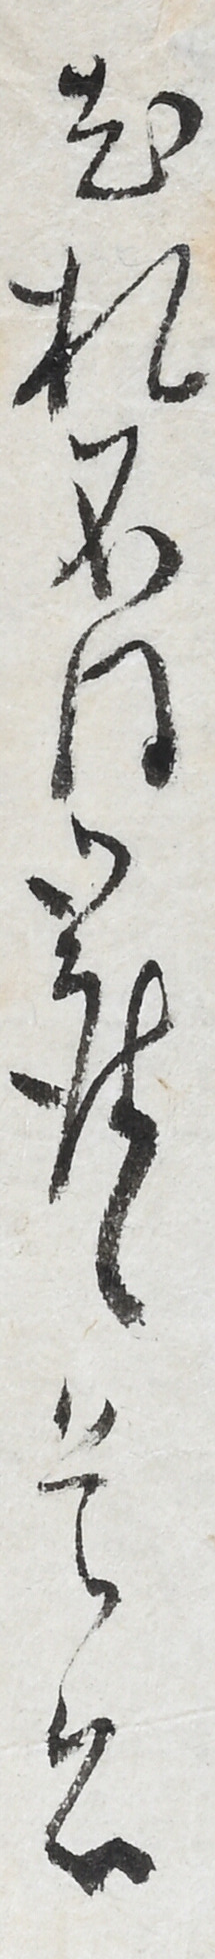尤札不同御座候是は
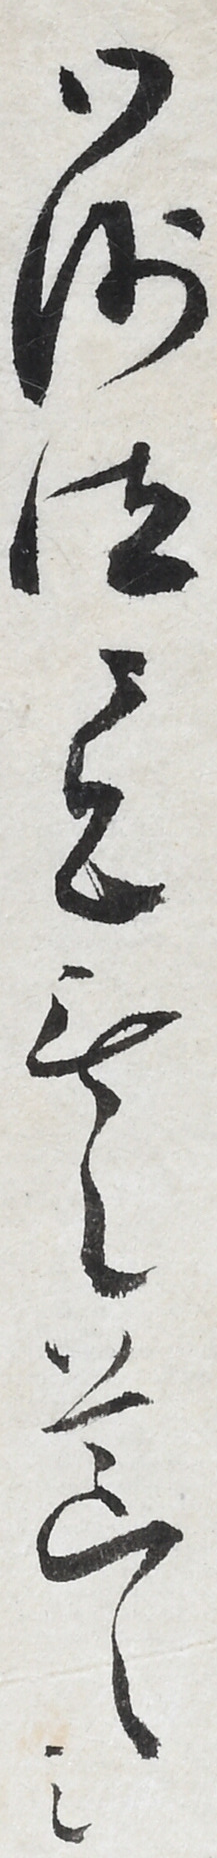御沙汰ニは無之道々之
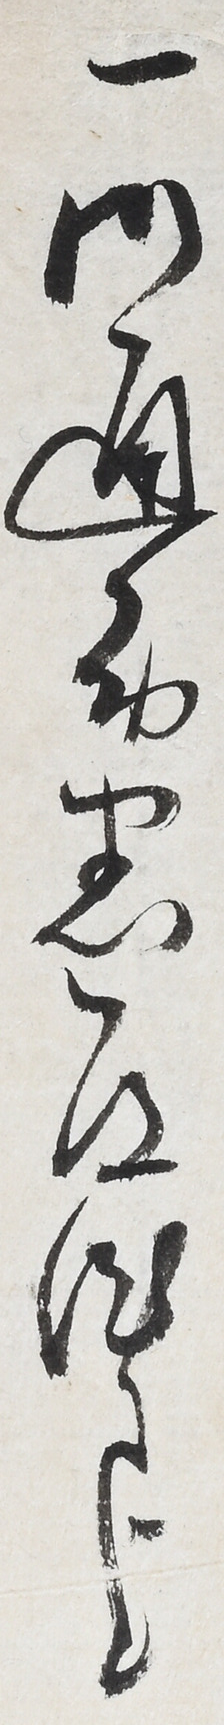一御通筋悉道作り申候
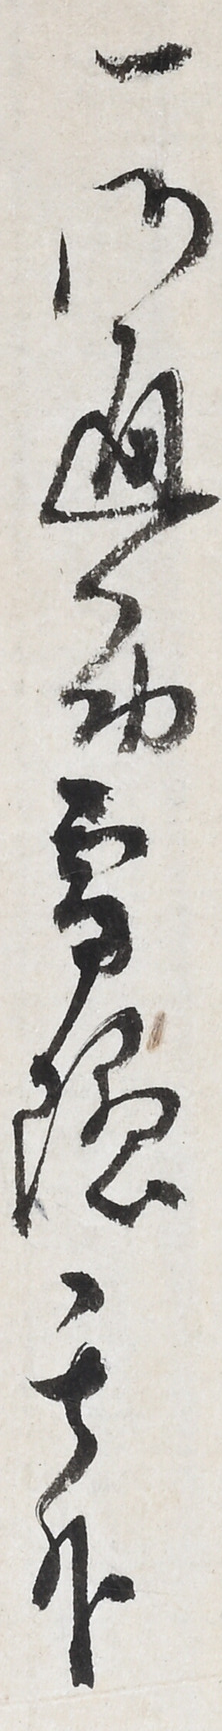一御通筋雪隠其外
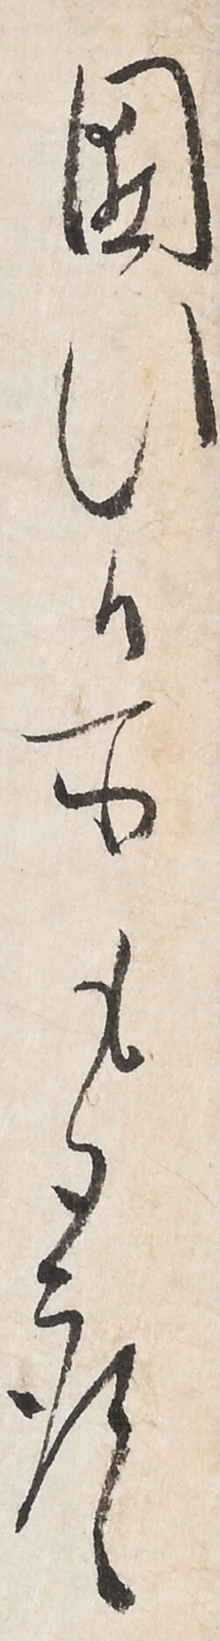囲ひ候所も御座候
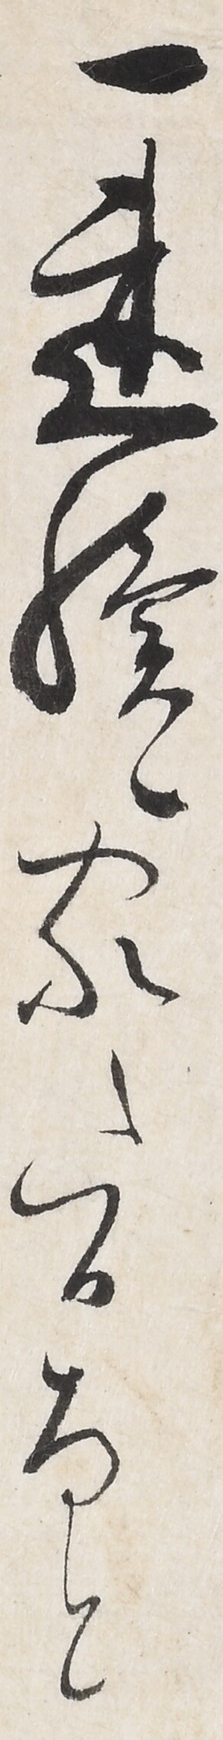一建続候家之間なと
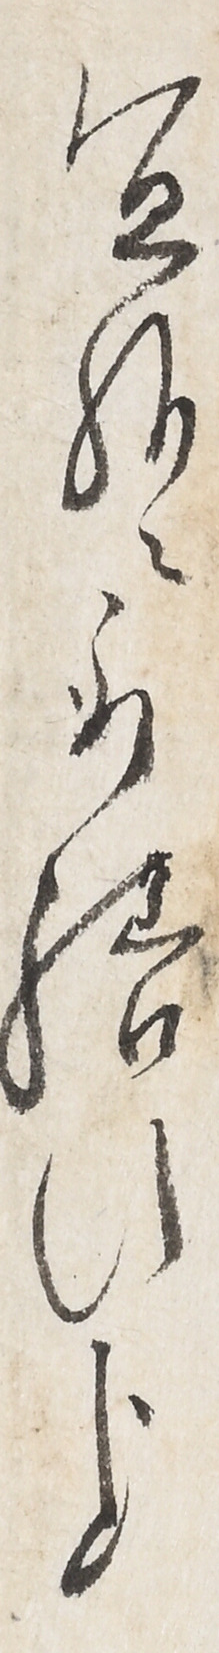宜様ニ取繕ひ申候
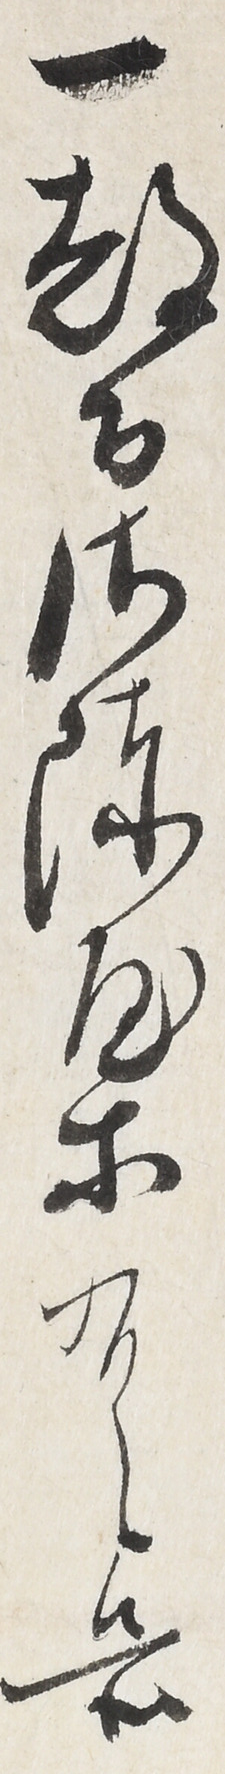一都而御陣屋等有之候所
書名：（覚書）
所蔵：伊那市立高遠町図書館・合同会社AMANE
